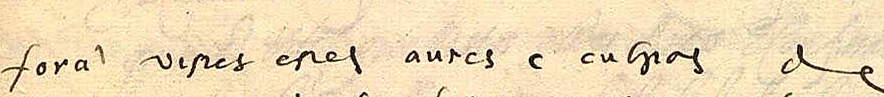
forā vistos estes autos e culpas de
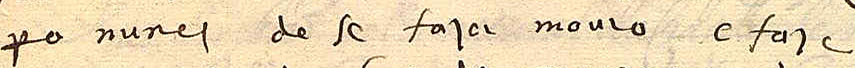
ꝑo nunes de se fazer mouro e faze
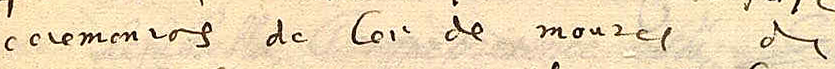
ceremonias da lei de mouros de
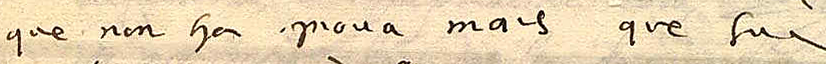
que non ha proua mais que sua
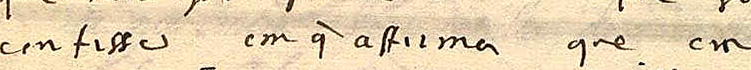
confissā em q̄ affirma que em
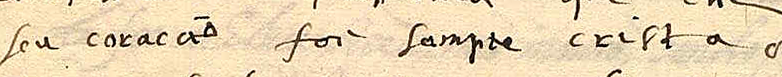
seu coraçaõ foi sempre cristaõ
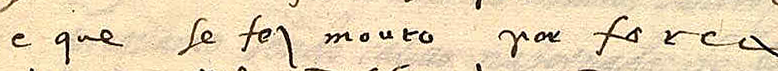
e que se fez mouro por força
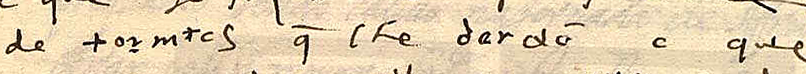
de tormtos q̄ lhe deraõ e que
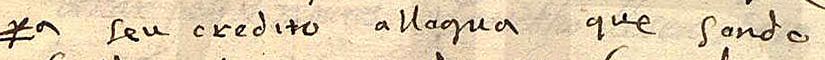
ꝑa seu credito allegua que sendo
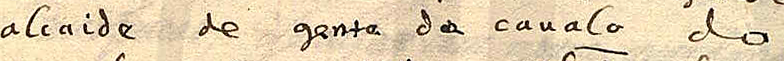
alcaide de gente de caualo do
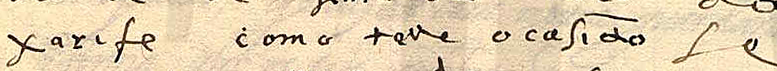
xarife como teve ocasião se
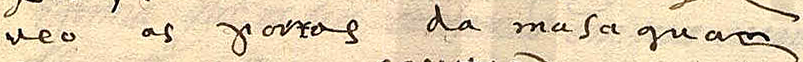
ueo as portas da masaguam
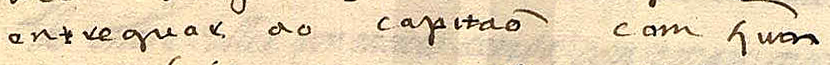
entreguar ao capitaõ com hum
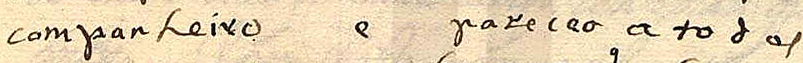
companheiro e pareceo a todos
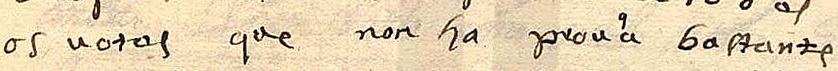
os uotos que non ha proua bastante
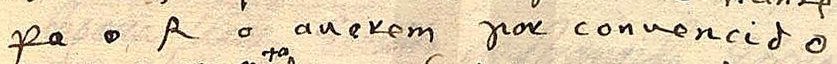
ꝑa o R o auerem por conuencido
